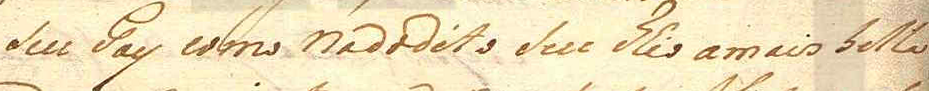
seu Pay como na do dito seu Tio a mais bella
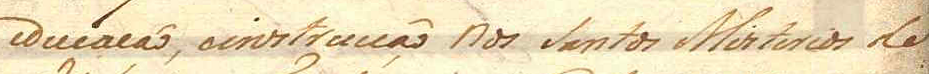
educaçaõ, e instrucção nos santos Misterios da
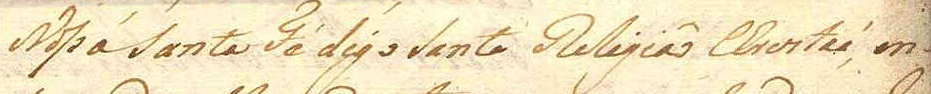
Nossa Santa Fé digo Santa Religiaõ Christaã, en
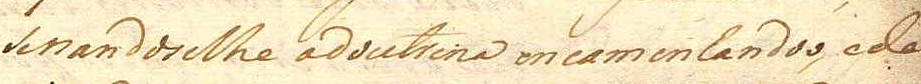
senandoselhe a doutrina encamenhandoo, e de
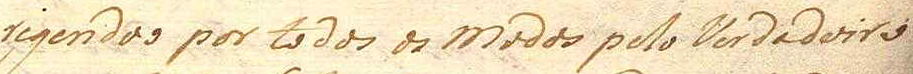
rigendoo por todos os modos pelo Verdadeiro
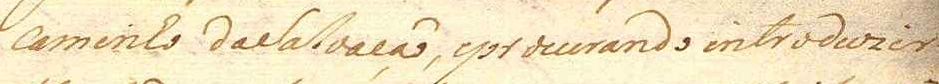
caminho da Salvaçaõ, e procurando introduzir
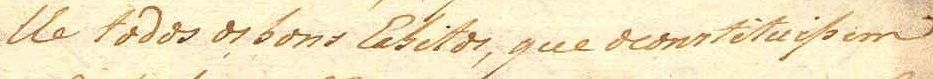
lhe todos os bons habitos, que o constituissem
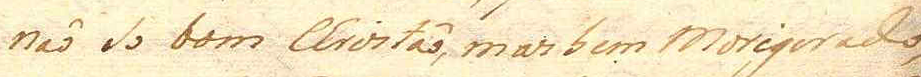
naõ so bom Christaõ, mas bem morigerado,
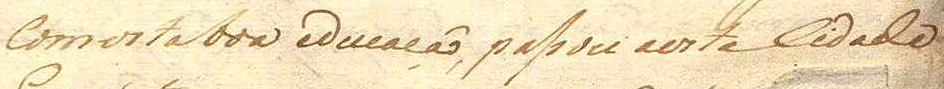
Com esta boa educaçaõ, passou a esta Cidade
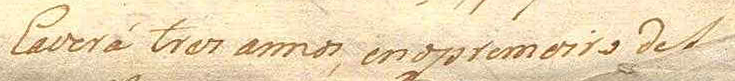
haverá tres annos, e no primeiro del
